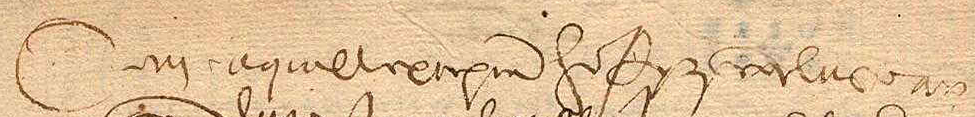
Com a quall excepçā ho fyz c̄ocluso ao
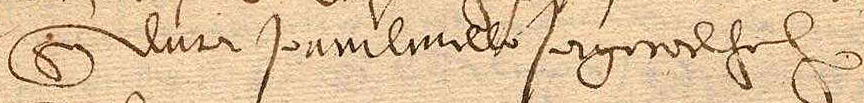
s̄or doutor Joam de mello Jorge coelho ho
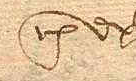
sp̄vy
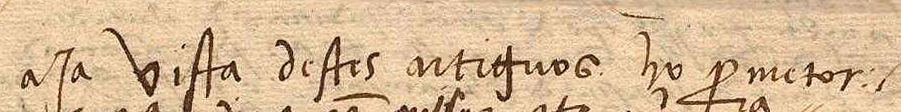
aJa vista destes artiguos ho ꝓmetor /
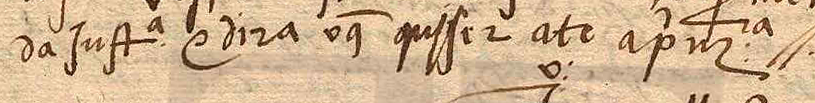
da Justa e dira o q̄ qujser ate a pimra //.
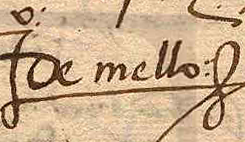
Jo de mello
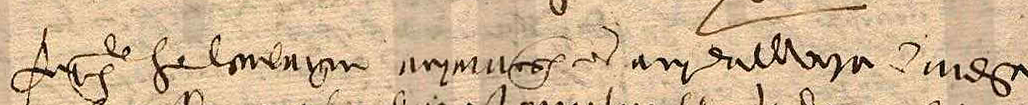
foy pdo ho desenbarguo acyma esp̄to ē a cydade devora ē audja
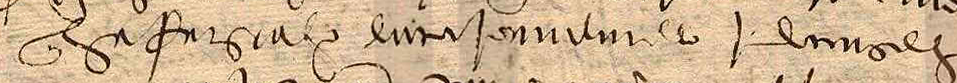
q̄ hi fazya ho doutor Joam de mello J. do conselho
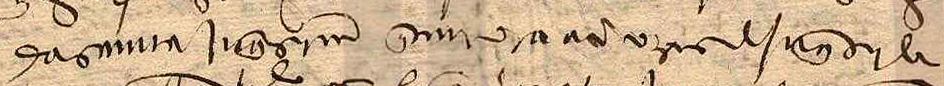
da samta Jnq̄syçā q̄ tem ora as vezes de Jnq̄sydor
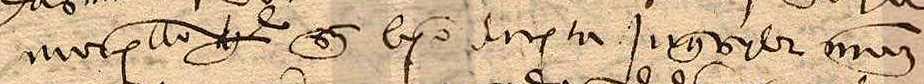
mor p̄llo Rdo s̄r bpō de cepta Jnq̄sydor moor
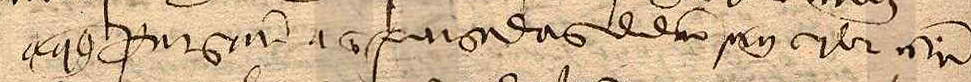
a q̄ll fazya ē as pousadas do dito jnq̄sydor estā
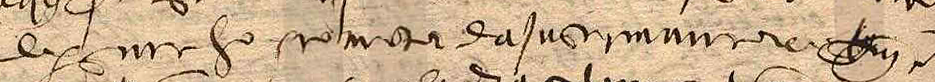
do ꝑsente ho promotor da Justyça autor e o Req̄rē
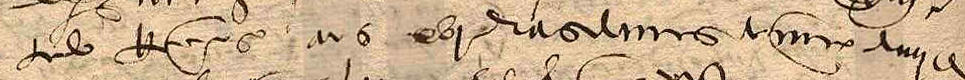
te do Reo p̄so aos xbj dias do mes de m̄ço de mjll
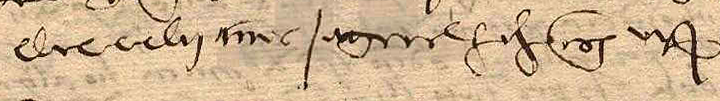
e bc xxxbij anos Jorge coelho ho esp̄vy
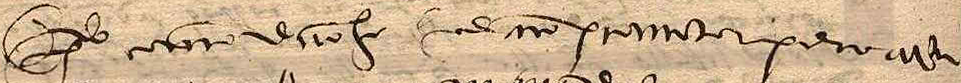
po corro de c̄o ho n̄o promotor pero ao
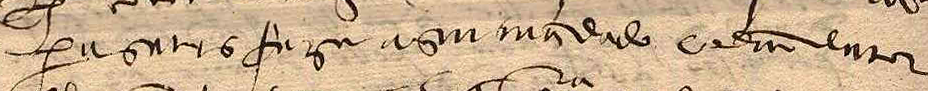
ꝑa satisfazer a seu mādado e dto doutor
